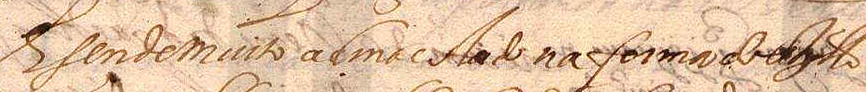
E sendo muito admoestado na forma do estyllo
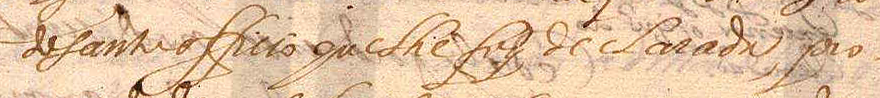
do santo officio que lhe foy declarada, pro
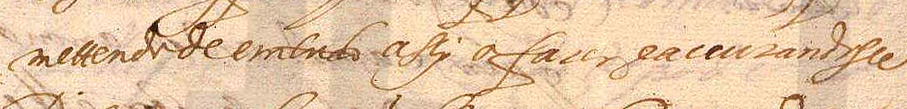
mettendo de em tudo assy o fazer e accuzandosse
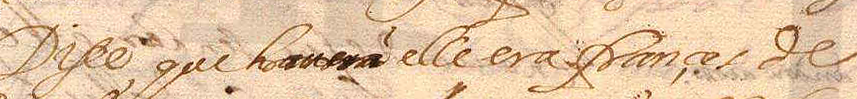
Disse que hauerá elle era frances de
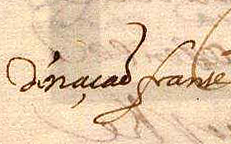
de naçaõ franses
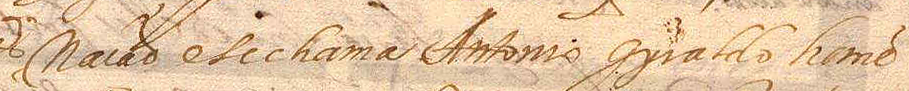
nação e se chama Antonio Gyraldo homē
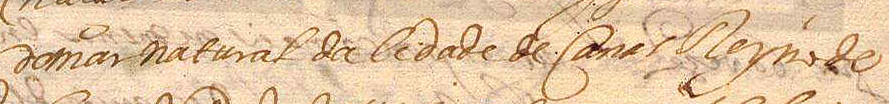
do mar natural da Cidade de Canas Reyno de
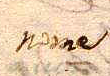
nome
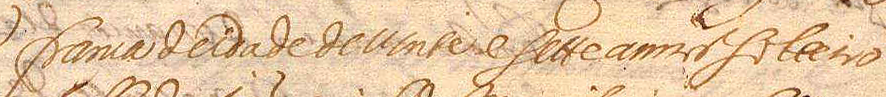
frança de idade de uinte e sette annos solteiro
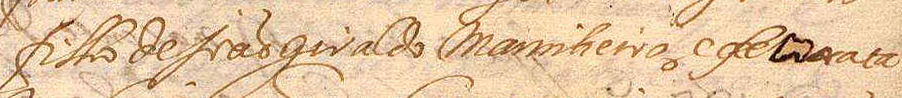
filho de joaõ giraldo marinheiro, e fe_ata
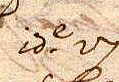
id.e 27
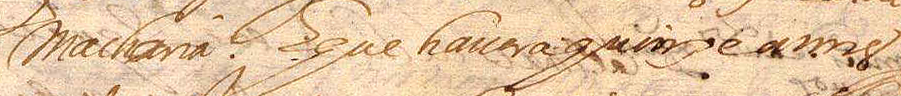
Macharia. E que hauera quinze annos
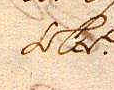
soltr.o
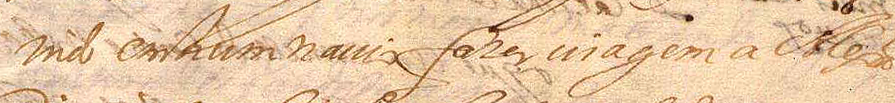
indo em hum nauio fazer uiagem a Alexā
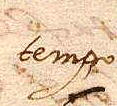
tempo
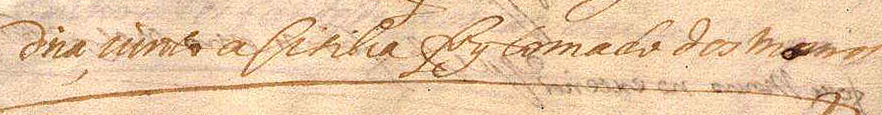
dria, iunto a Cisilia foy tomado dos mouros
